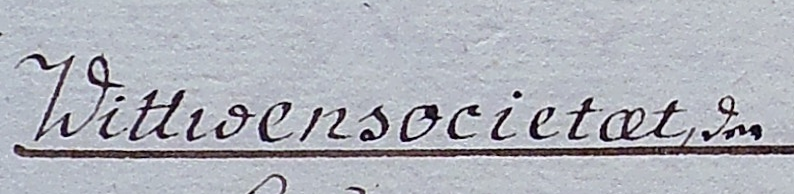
Wittwensocietat, der
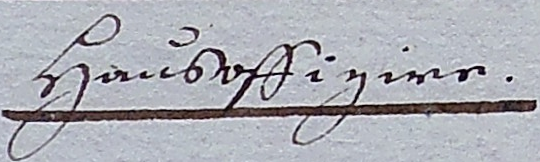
Hausoffiziere.
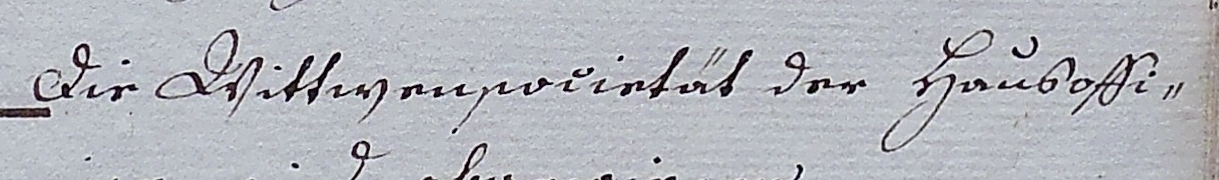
Die Wittwensocietät der Hausoffi¬
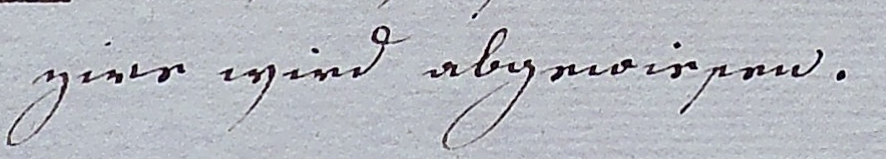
ziere wird abgewiesen.
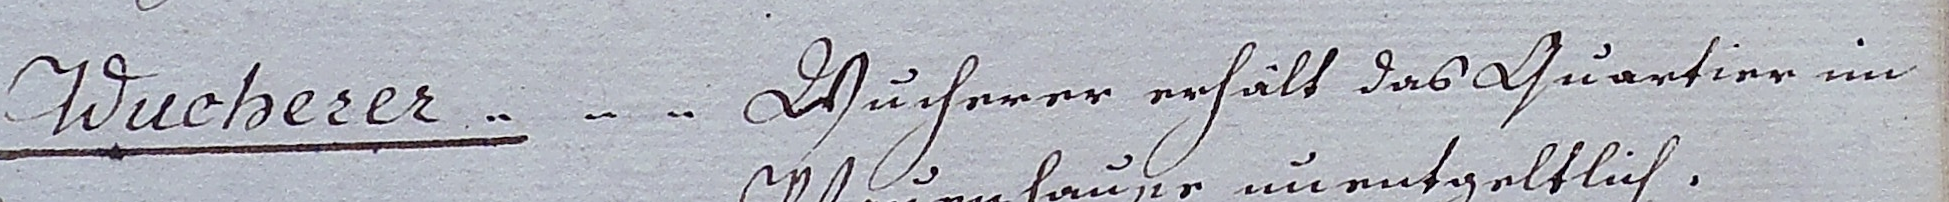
Wucherer .. .. .. Wucherer erhält das Quartier im
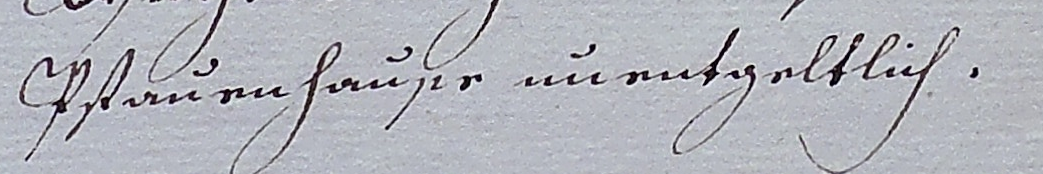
Pfauenhause unentgeltlich.
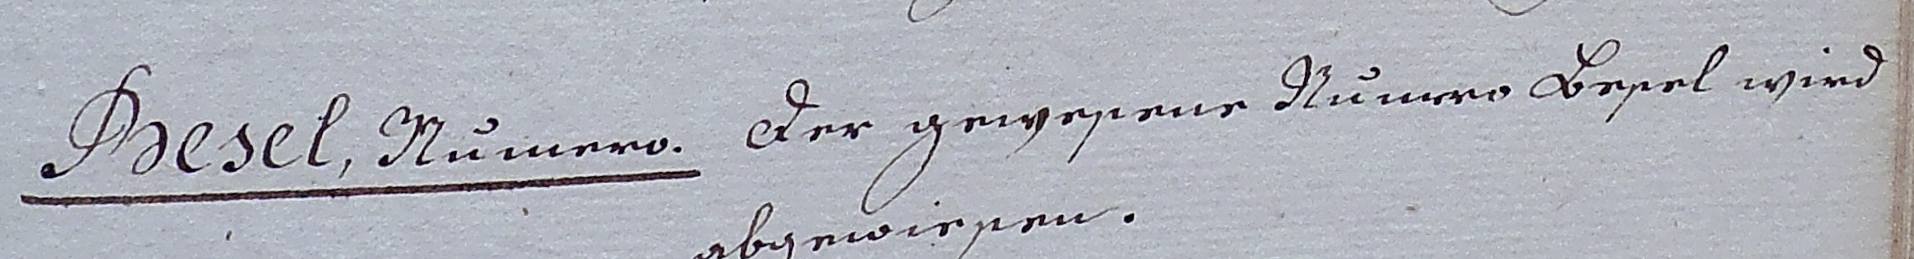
Besel, Numero. Der gewesene Numero Besel wird
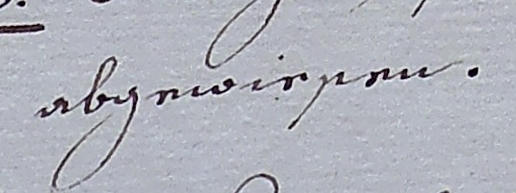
abgewiesen.
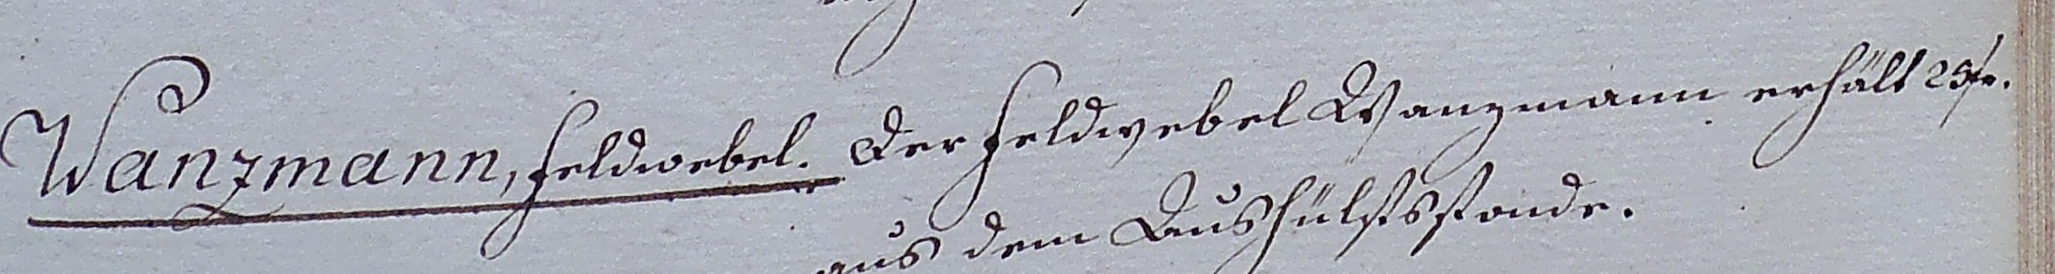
Wanzmann, Feldwebel. Der Feldgebel Wanzmann erhält 25fr.
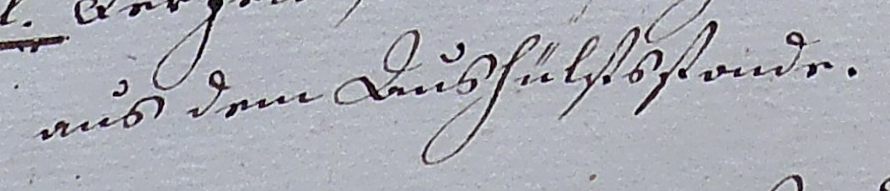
aus dem Aushülfsfonde.
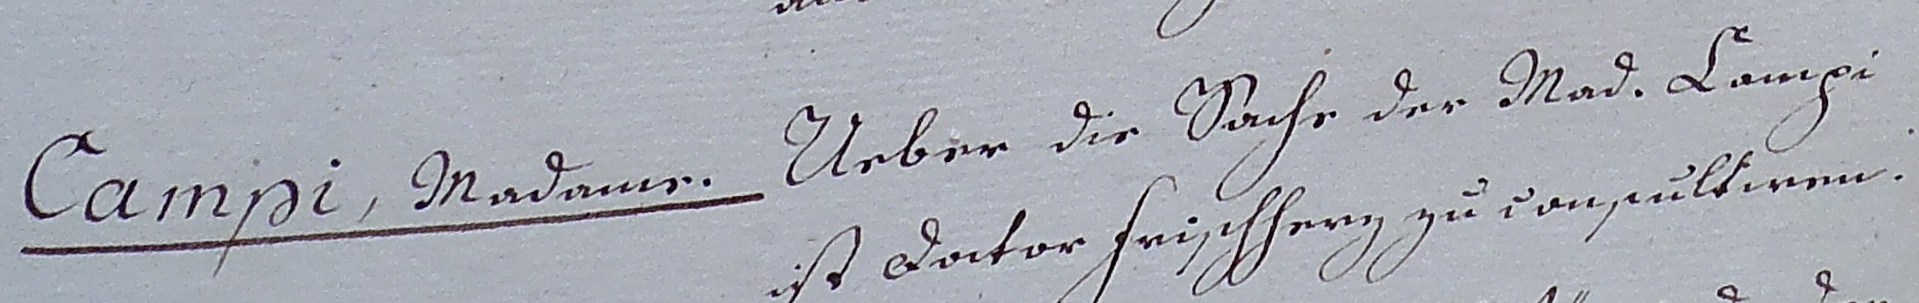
Campi, Madame. Ueber die Sache der Mad. Campi
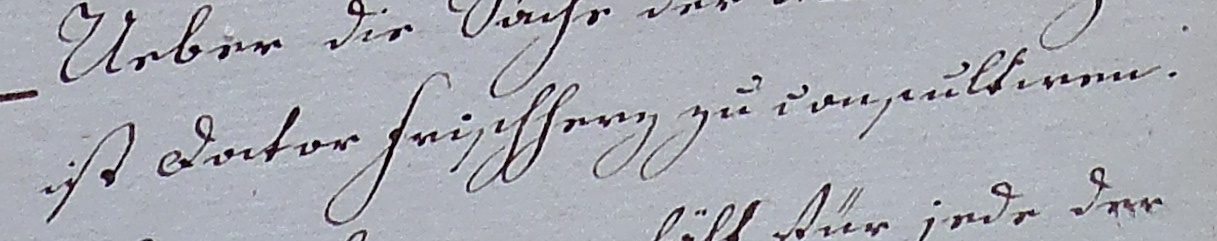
ist Doctor Frischherz zu consultiren.
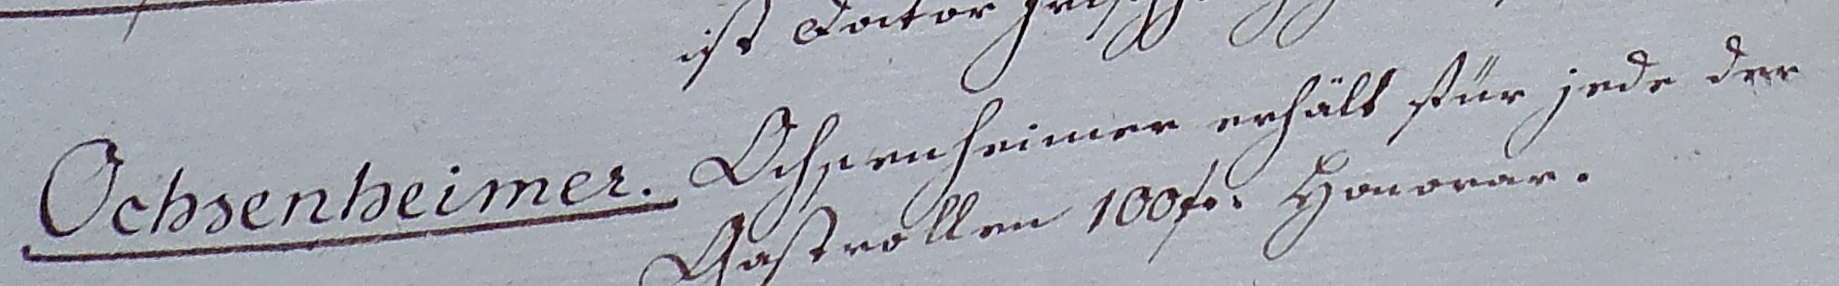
Ochsenheimer. Ochsenheimer erhält für jede der
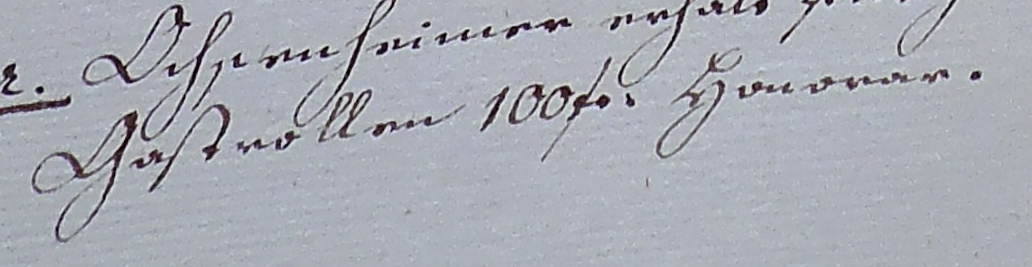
Gastrollen 100fr. Honorar.
